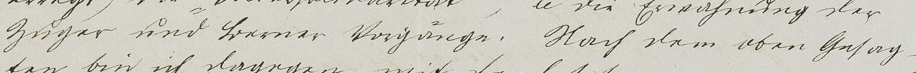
Zuger und Berner Vorgänge. Nach dem oben Gesag-
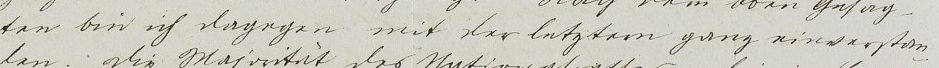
ten bin ich dagegen mit der letztern ganz einverstan-
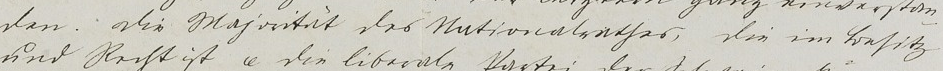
den. Die Majorität des Nationalrathes, die im Besitz
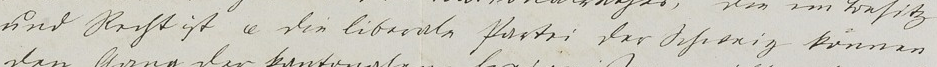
und Recht ist & die liberale Partei der Schweiz können
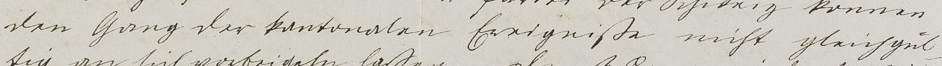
den Gang der kantonalen Ereignisse nicht gleichgül-
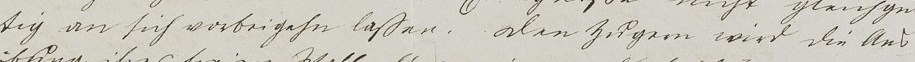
tig an sich vorbeigehn lassen. Den Zugern wird die Aus-
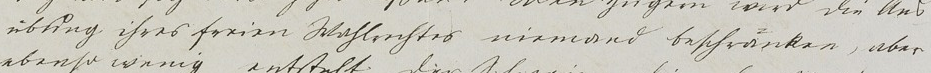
übung ihres freien Wahlrechtes niemand beschränken, aber
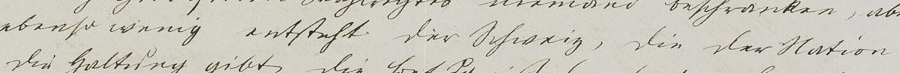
ebenso wenig entsteht der Schweiz, die der Nation
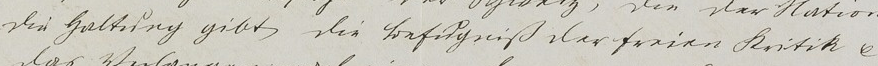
die Haltung gibt, die Befugniß der freien Kritik &
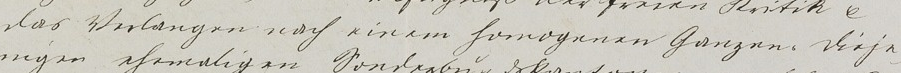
das Verlangen nach einem homogenen Ganzen. Dieje-
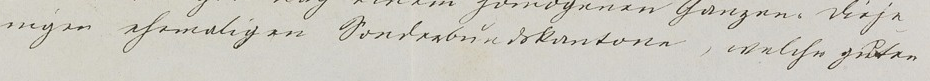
nigen ehemaligen Sonderbundskantone, welche guten
